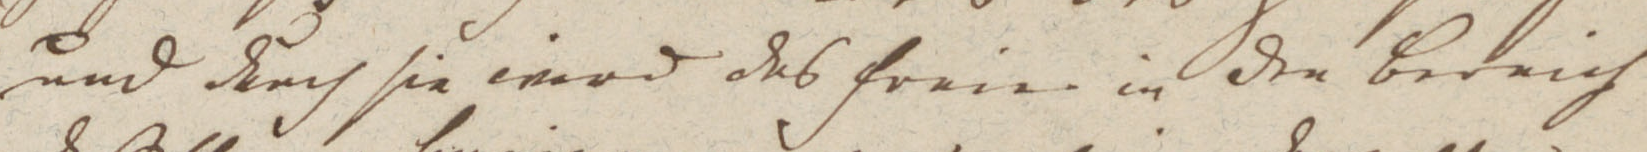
und durch sie wird das Freie in den Bereich
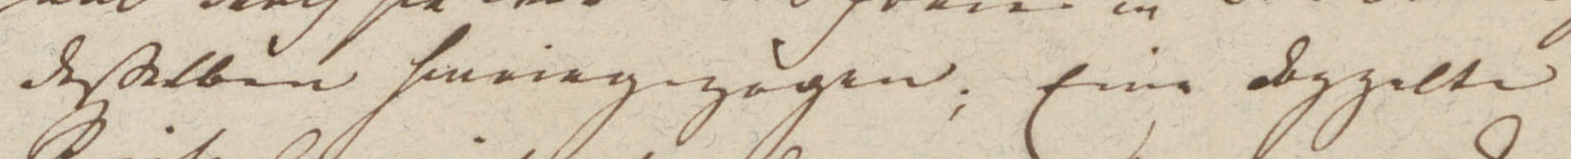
desselben hineingezogen; Eine doppelte
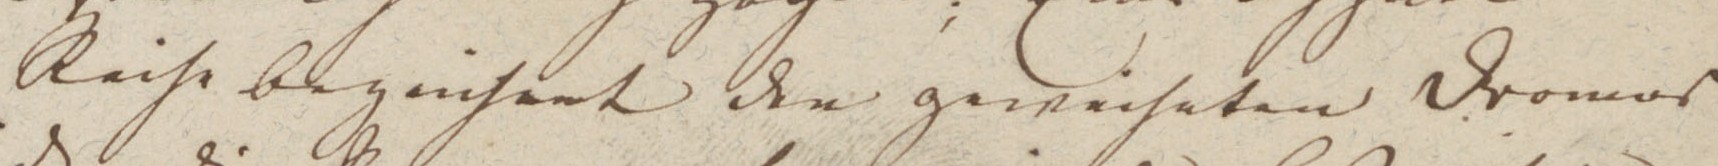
Reihe bezeichnet den geweiheten Dromos
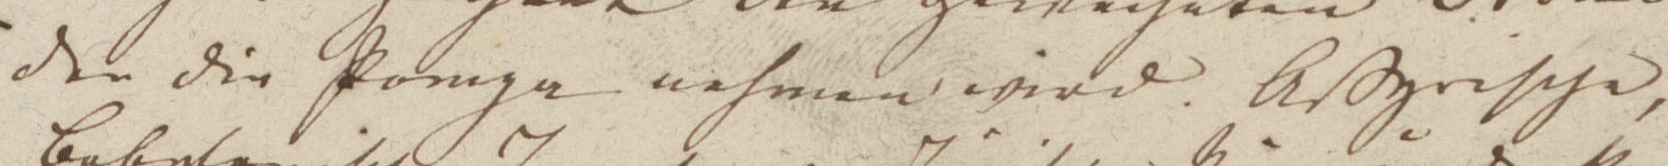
den die Pompa nehmen wird. Assyrische,
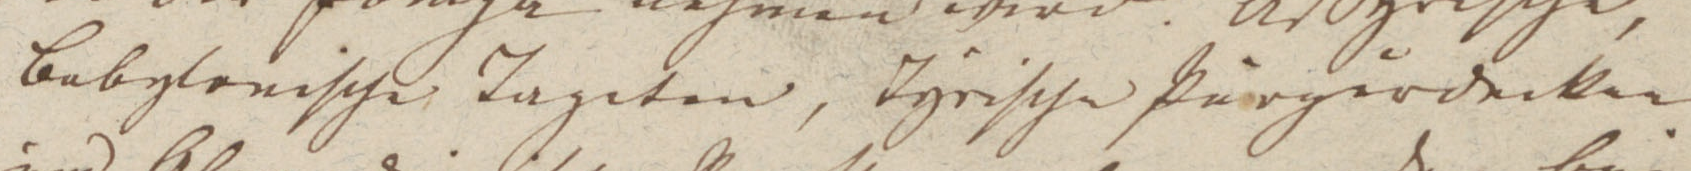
Babylonische Tapeten, Tyrische Purpurdecken
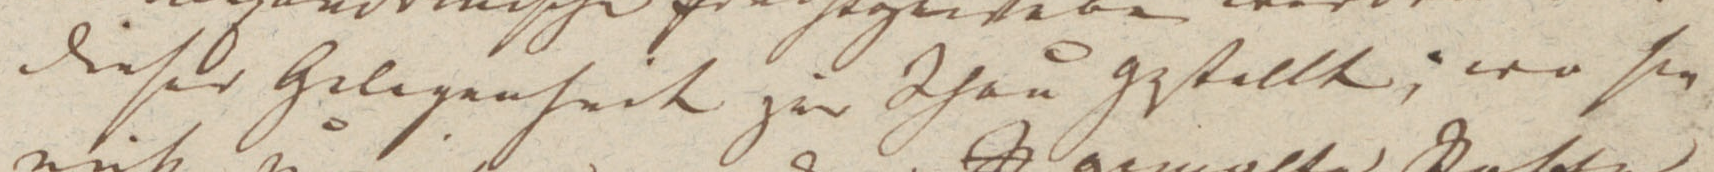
dieser Gelegenheit zur Schau gestellt; wo sie
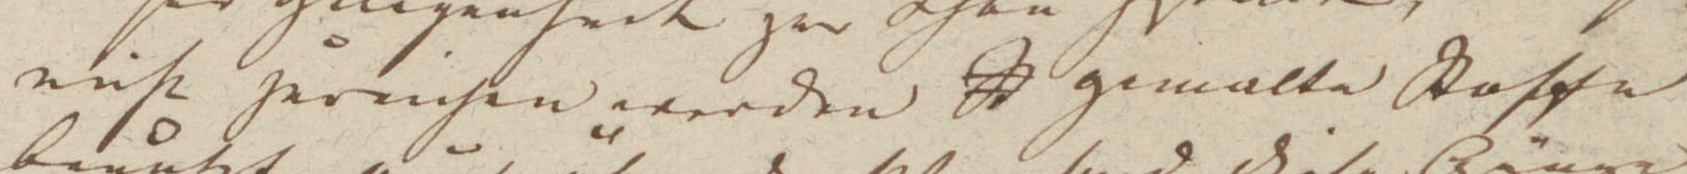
nicht zureichen werden St gemalte Stoffe
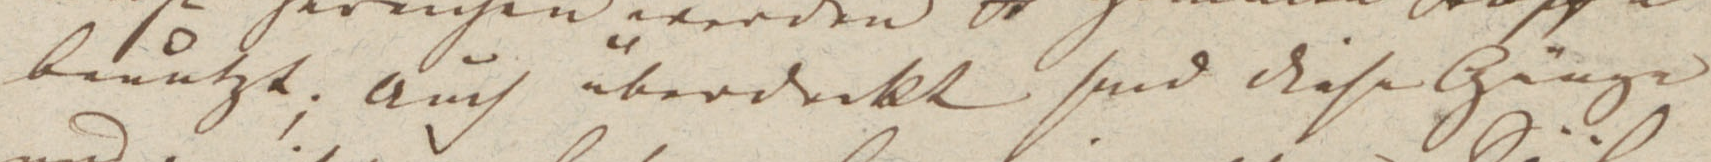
benutzt; Auch überdeckt sind diese Gänge
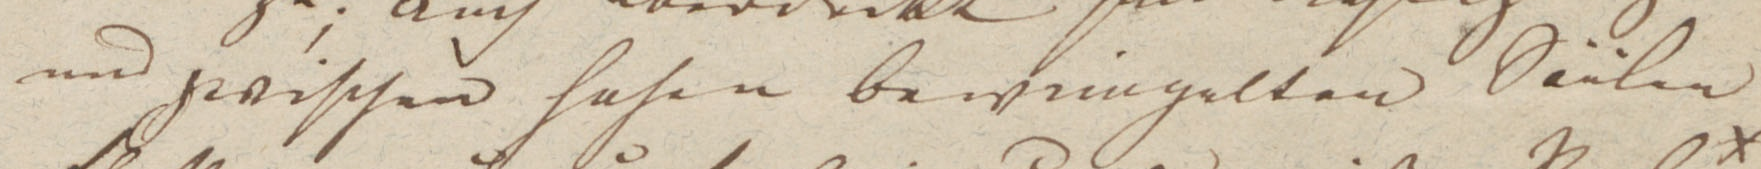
und zwischen hohen bewimpelten Säulen
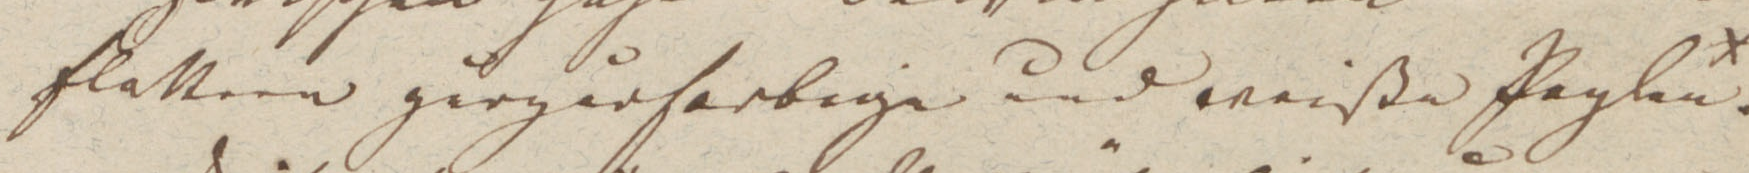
flattern purpurfarbige und weisse Peplen.%
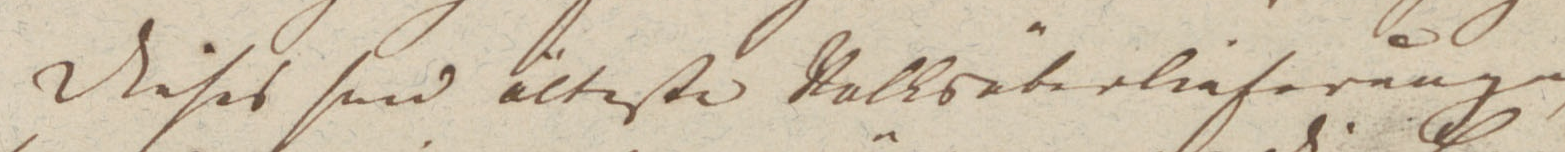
Dieses sind älteste Volksüberlieferungen
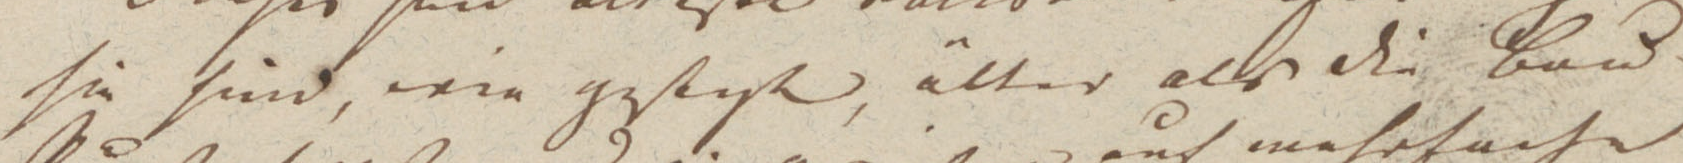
sie sind, wie gesagt, älter als die Bau-
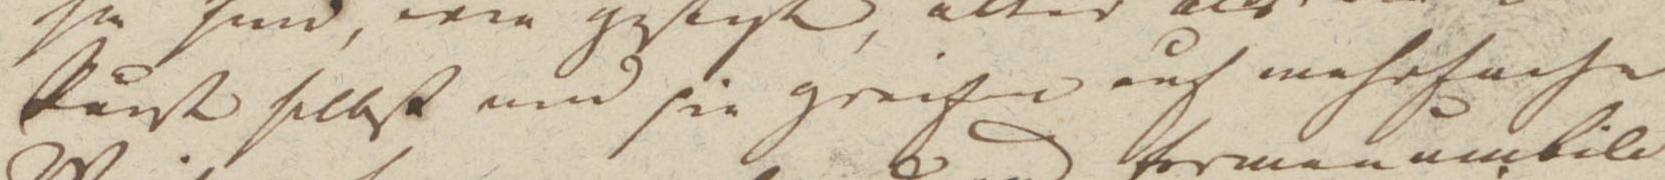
kunst selbst und sie greifen auf mehrfache
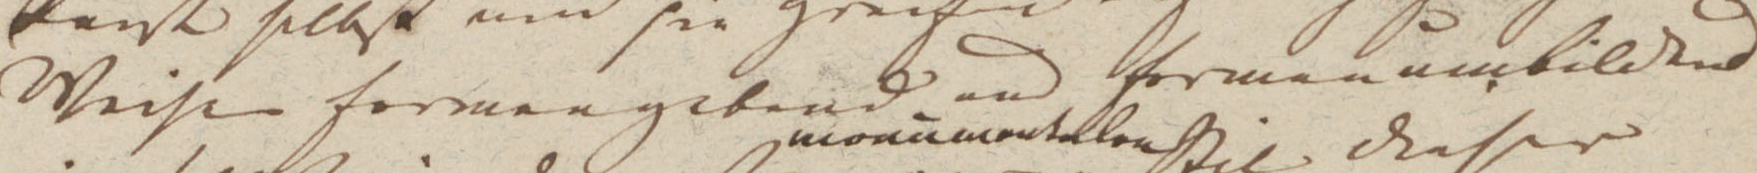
Weise formengebend und formenumbildend
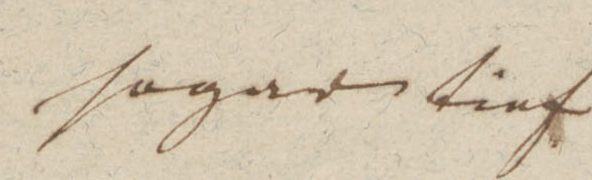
sogar tief
